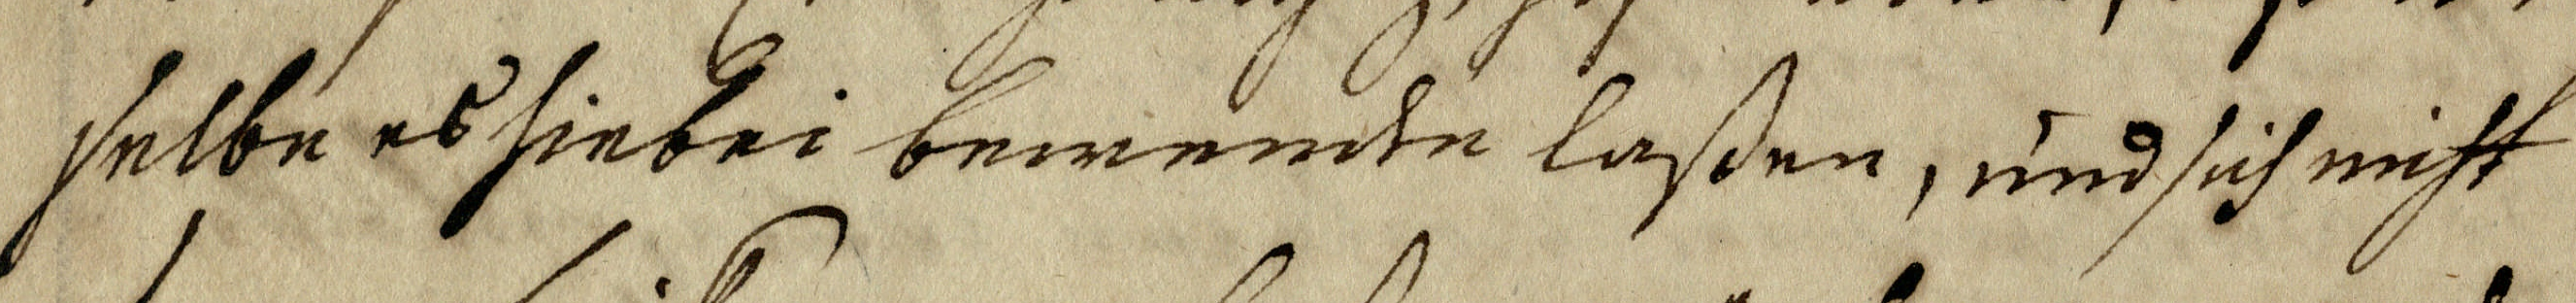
selbe es hiebei bewenden laßen, und sich nicht
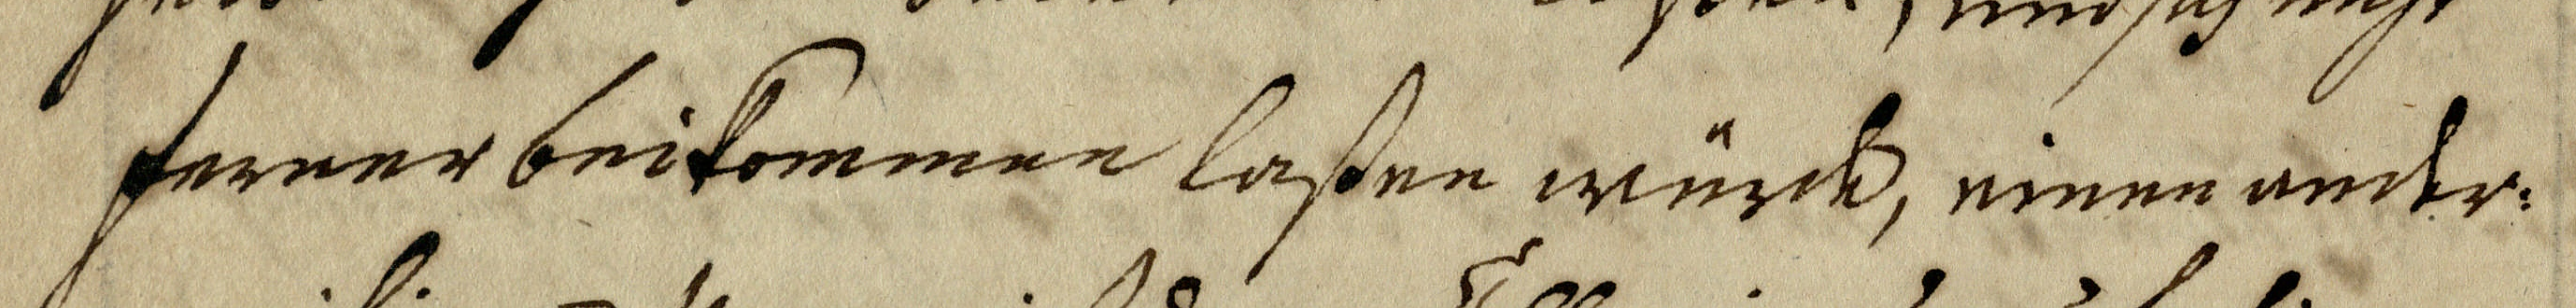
ferner beikommen laßen würde, einen ander¬
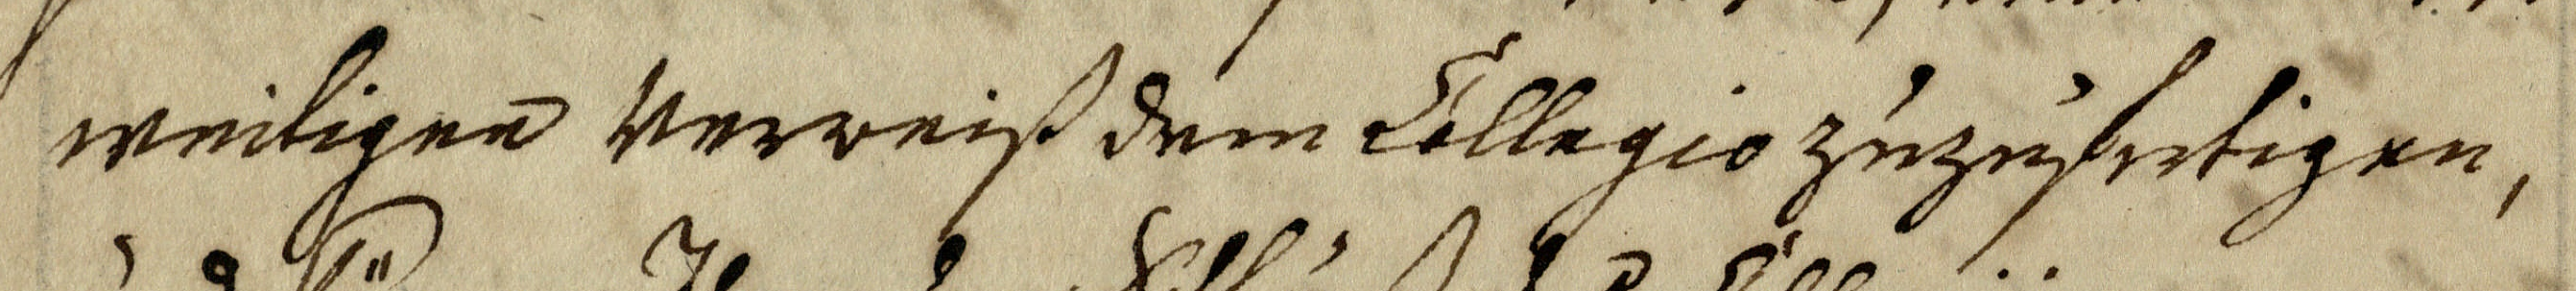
weitigen Verweis dem Collegio zuzufertigen,
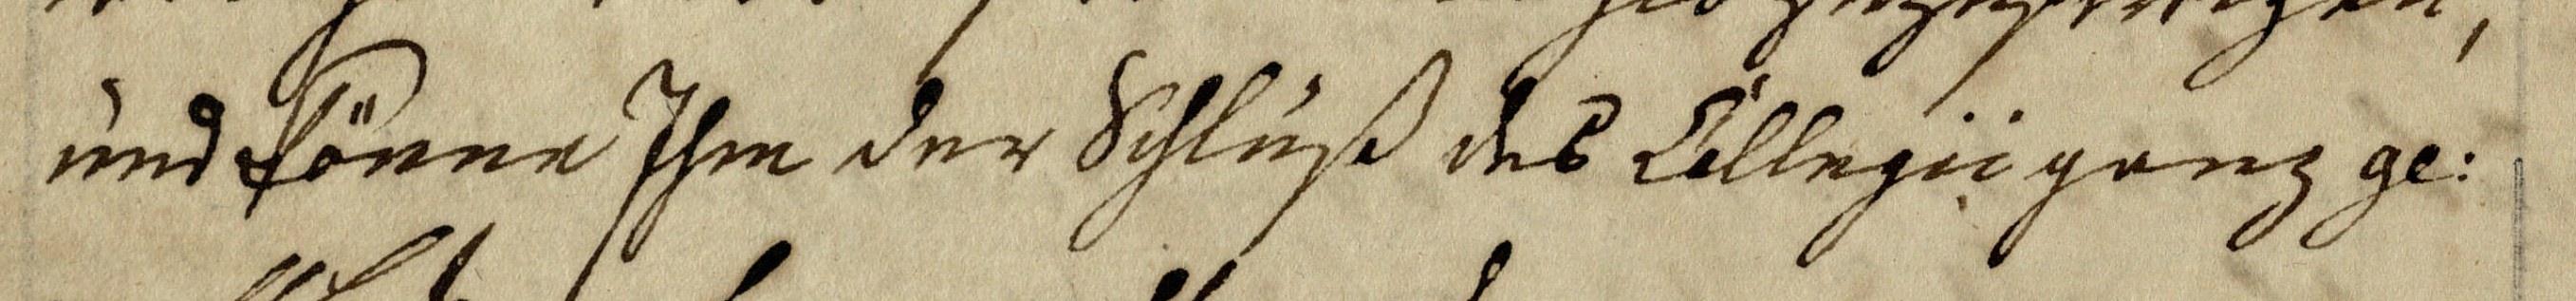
und könne Ihm der Schluß des Collegii ganz ge¬
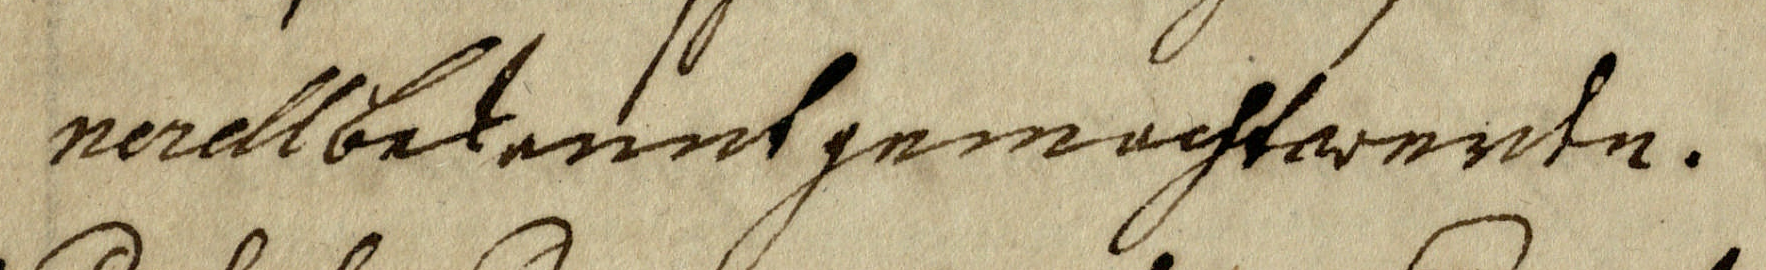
nerell bekannt gemacht werden.
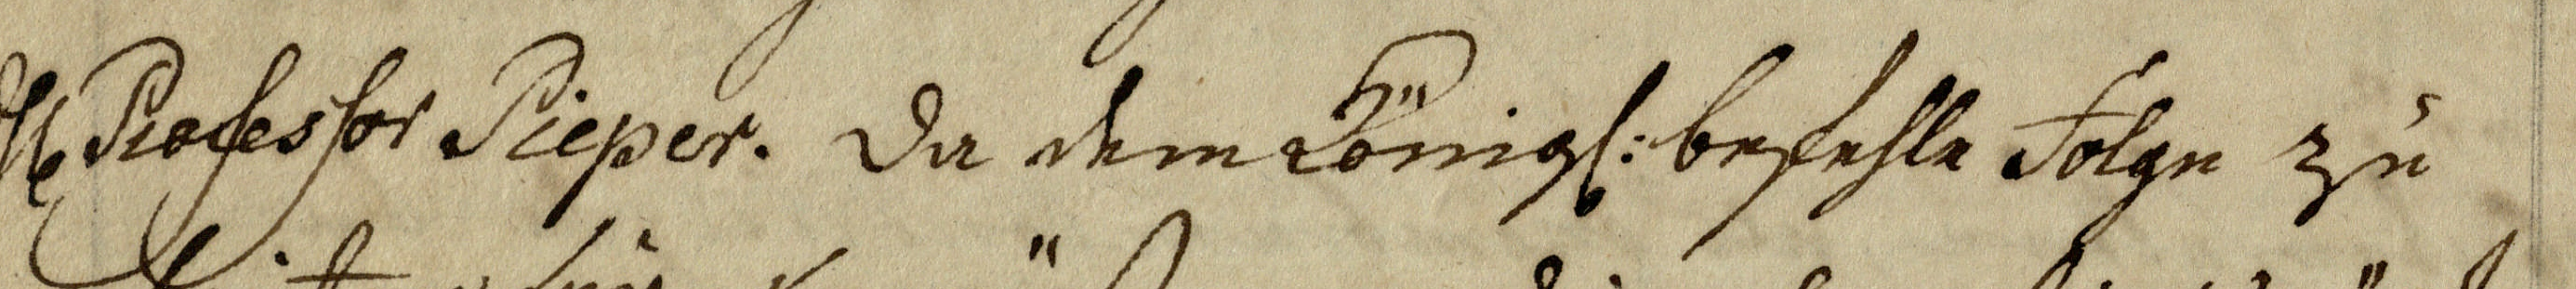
dh Professor Pieper. Da dem Königl. Befehle Folge zu
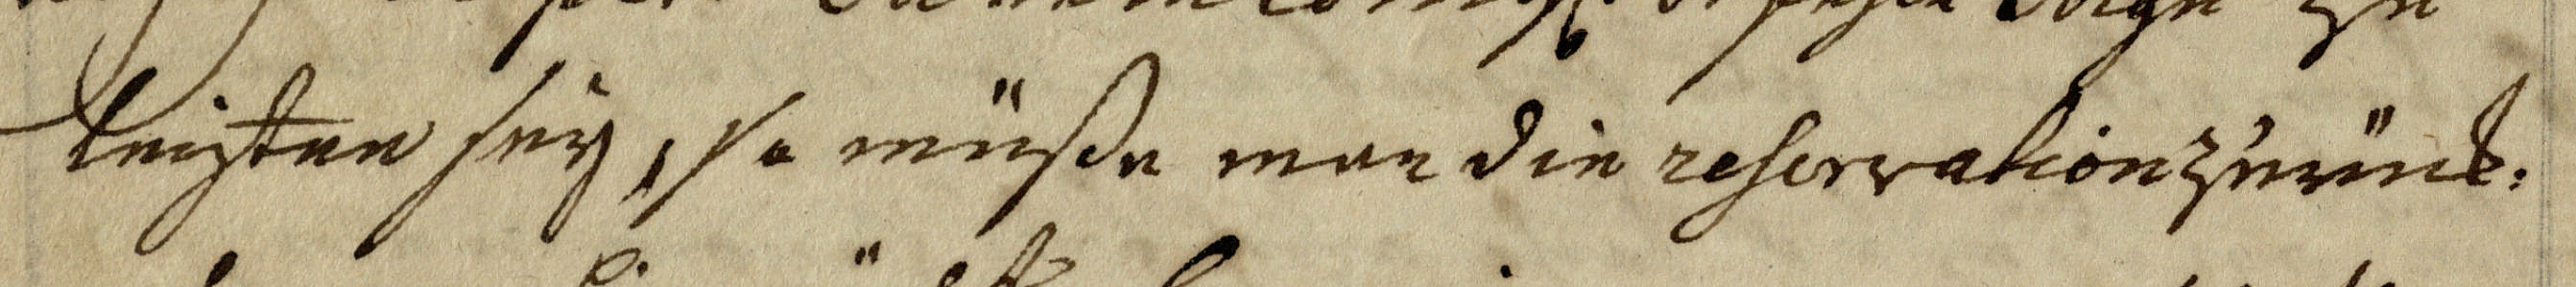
leisten seÿ, so müße man die reservation zurück¬
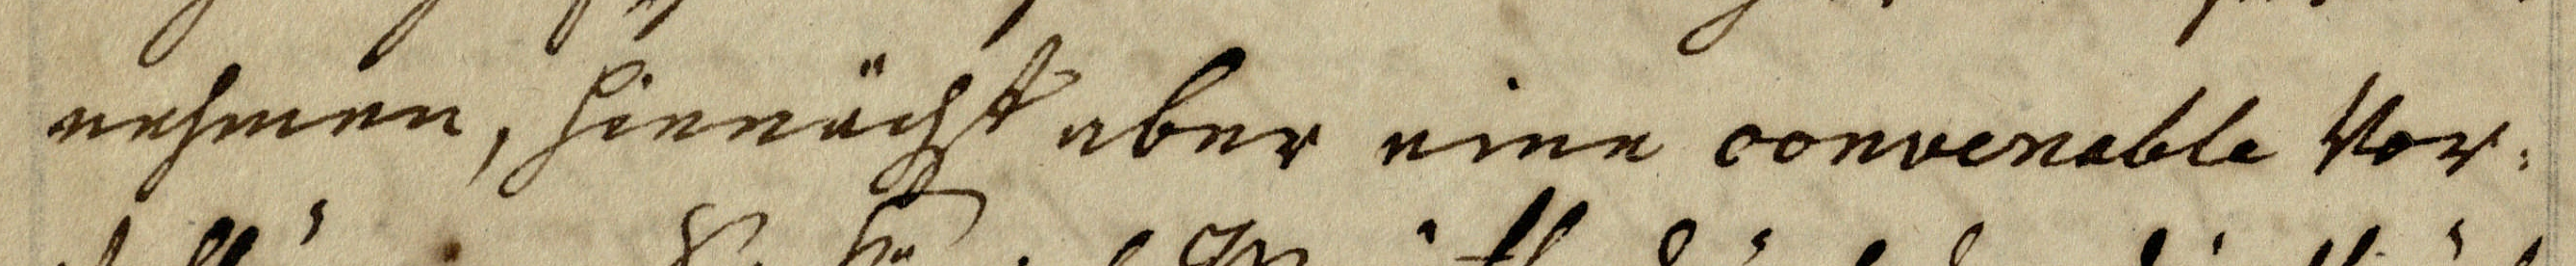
nehmen, hienächst aber eine convenable Vor¬
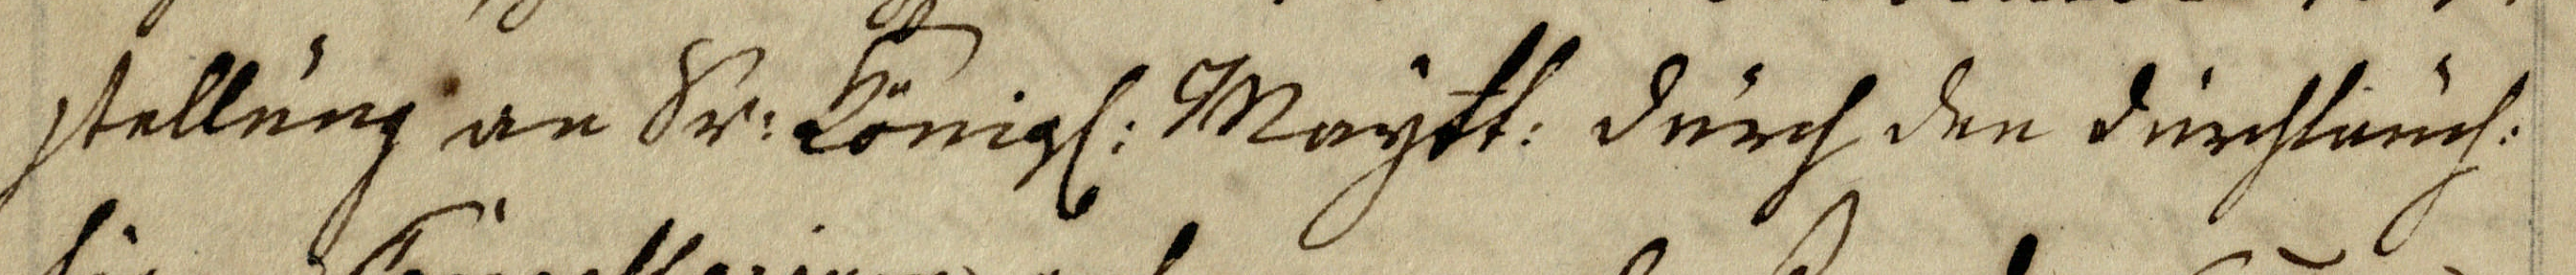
stellung an Sr. Königl. Maÿtt. durch den durchlauch¬
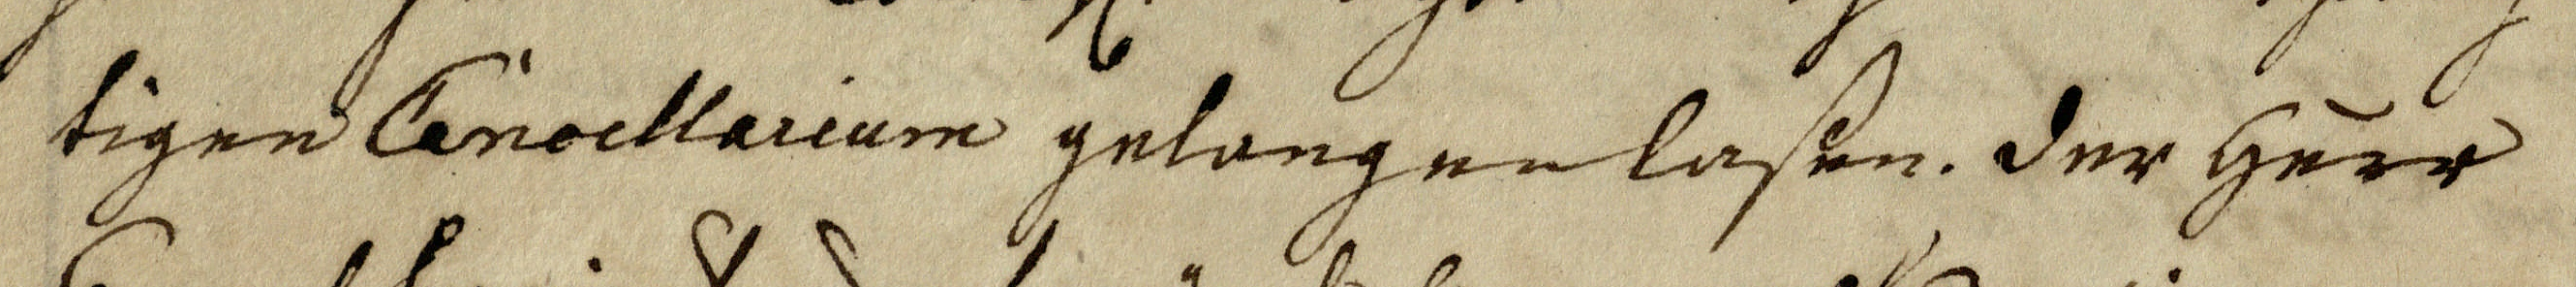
tigen Cancellarium gelangenlaßen. Der Herr
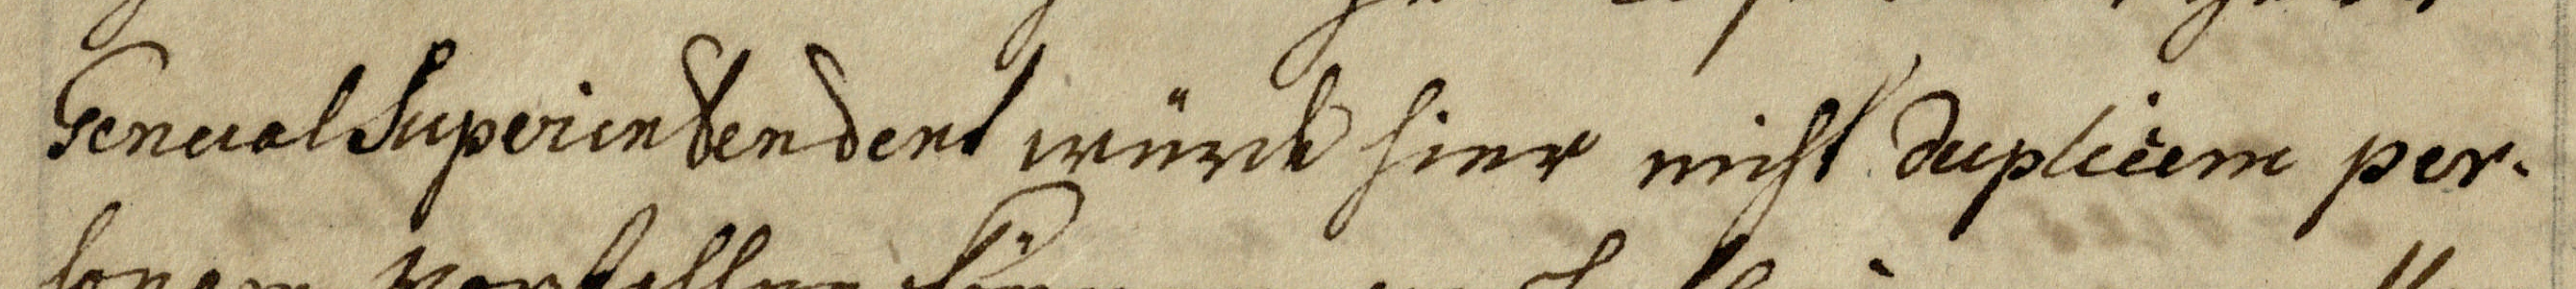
GeneralSuperintendent würde hier nicht duplicem per¬
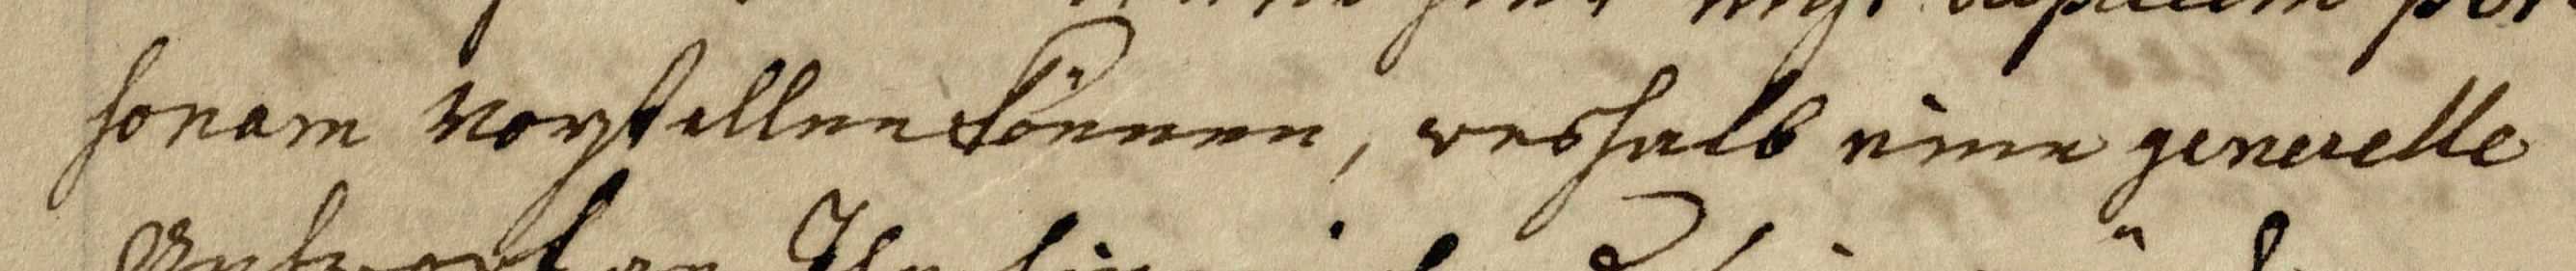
sonam vorstellen können, weshalb eine generelle
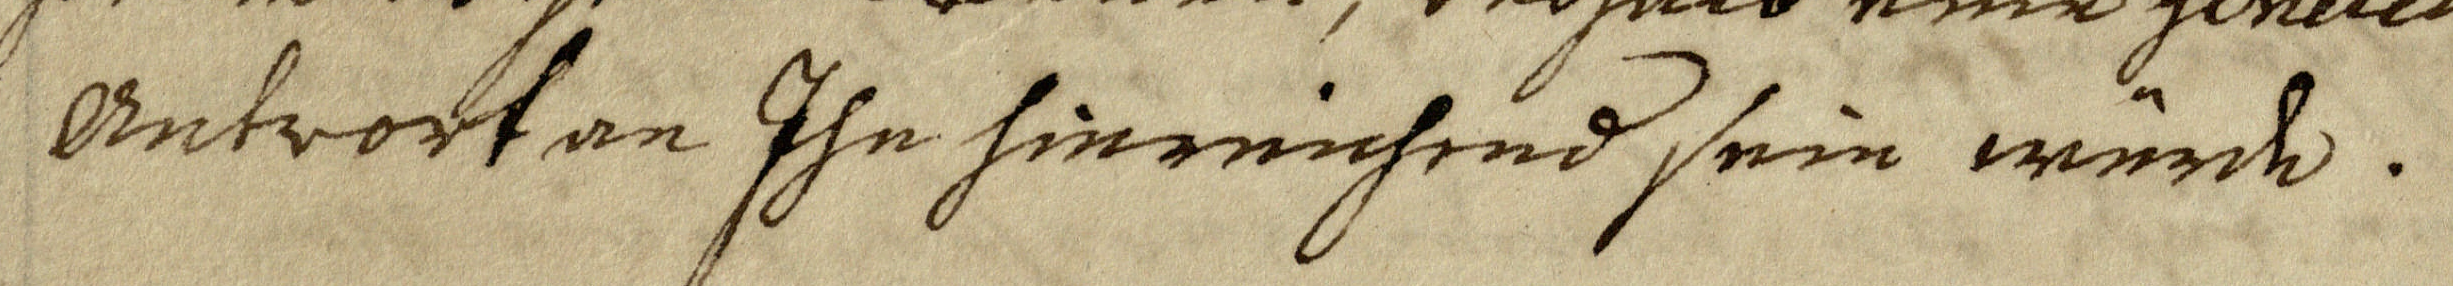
Antwort an Ihn hinreichend sein würde.
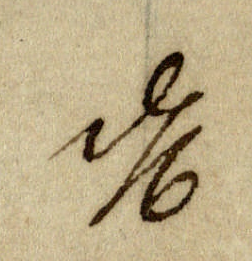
dh.
